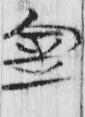金
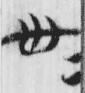三十
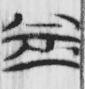益
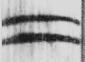二
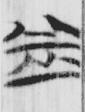益
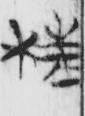株
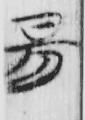昜（陽）
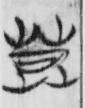莫
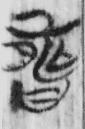壽
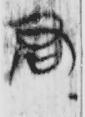君
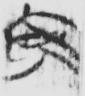安
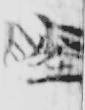陵
